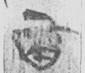百
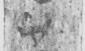廿
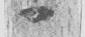四
